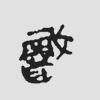職
